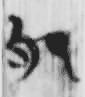肥
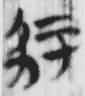○（冢）
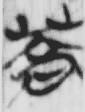蒿
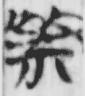祭
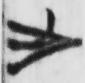之
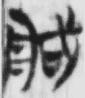戕
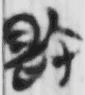敢
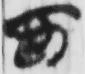爲
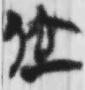位
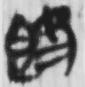既
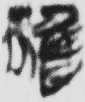禱
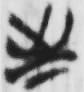至
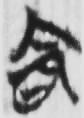命
